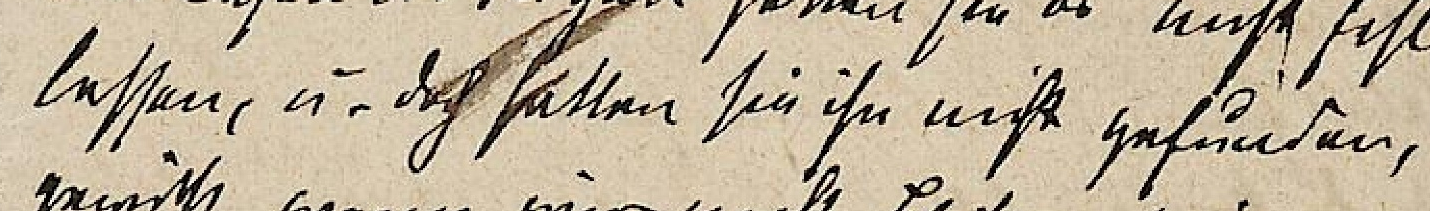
lassen, u. doch hatten sie ihn nicht gefunden,
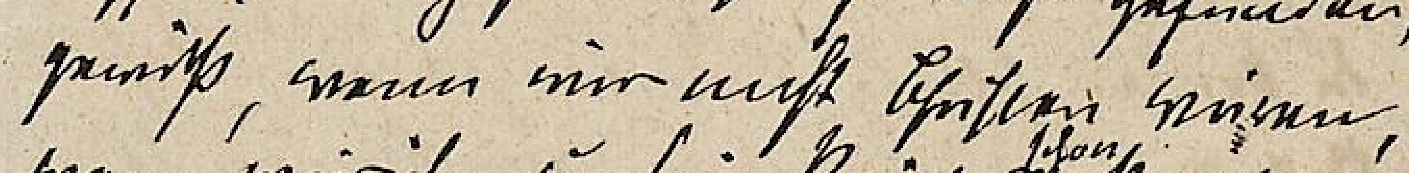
gewiß, wenn wir nicht Christen wären,
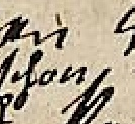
schon
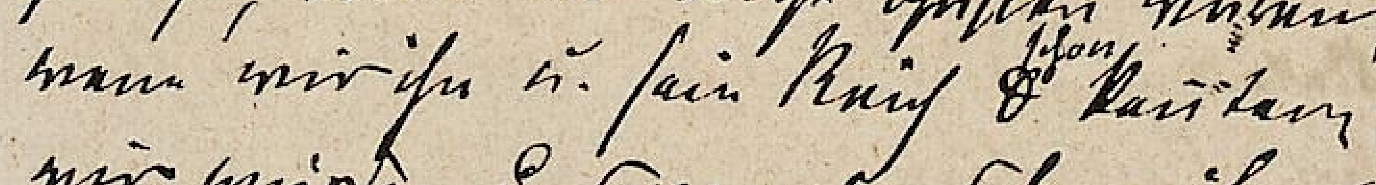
wenn wir ihn u. sein Reich o kenten,
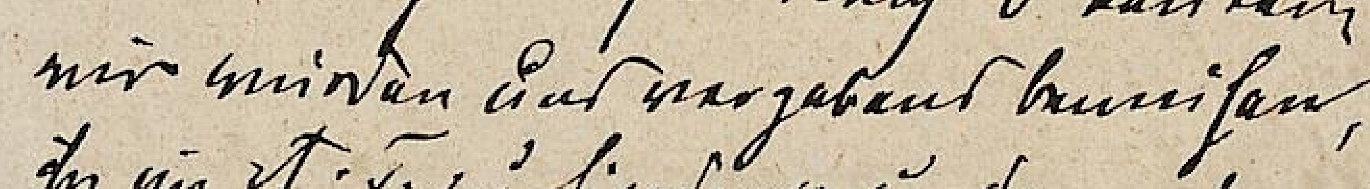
wir würden uns vergebens bemnühen,
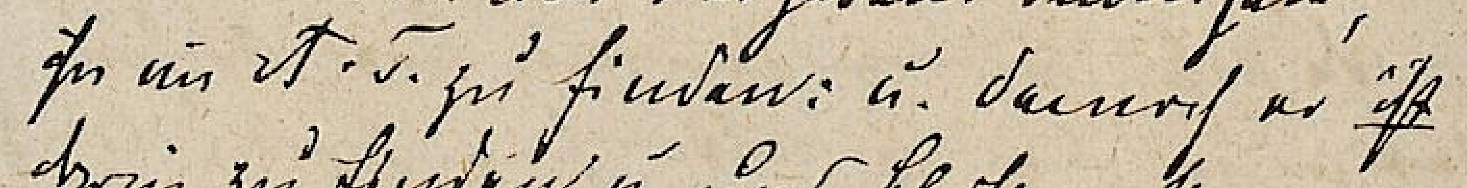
ihn im A.T. zu finden: u. dennoch er ist
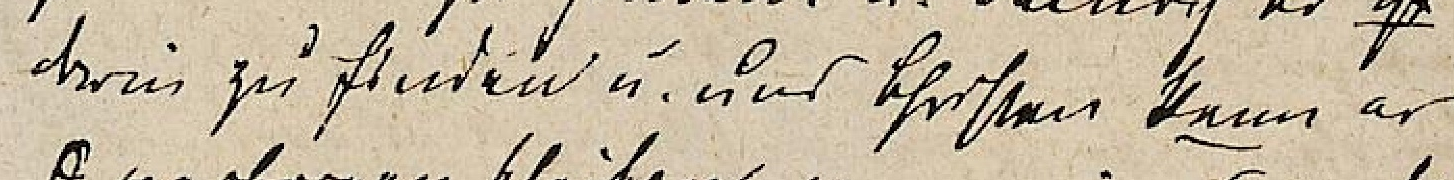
darin zu finden u. uns Christen kann er
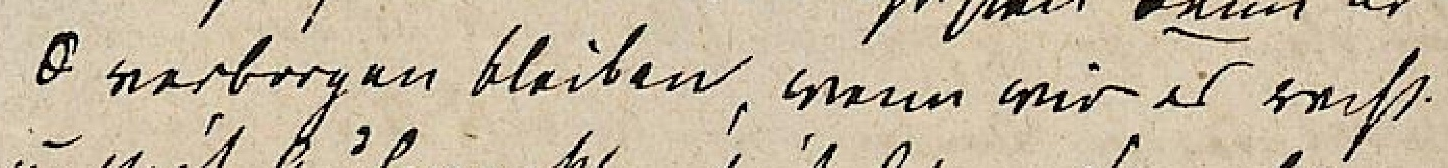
o verborgen bleiben, wenn wir es recht
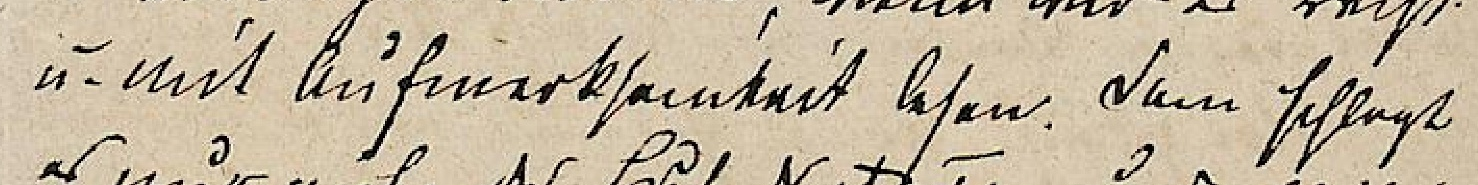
u. mit Aufmerksamkeit lesen. Denn schlagt
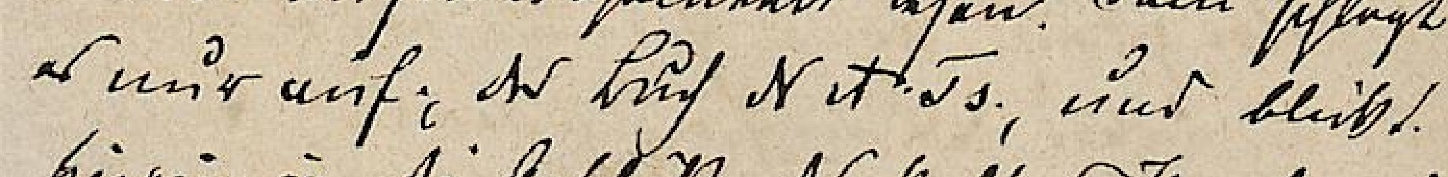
es nur auf; das Buch ds A.Ts. und blickt.
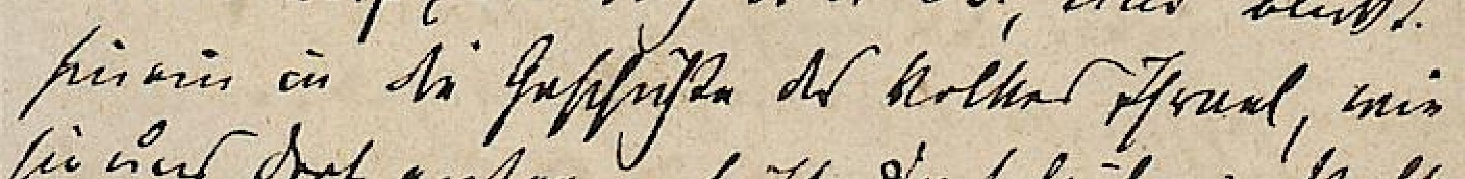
hinein in die Geschichte des Voltes Israel, wie
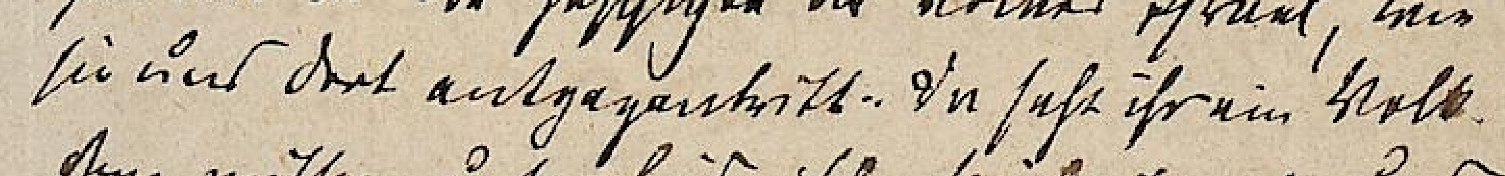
sie uns dort entgegentritt. Da seht ihr ein Volk
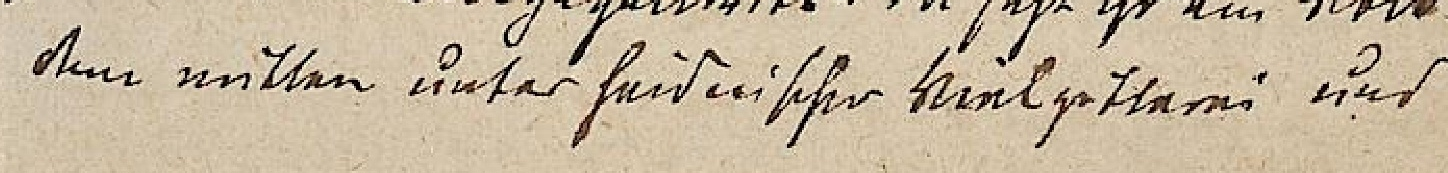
dem mitten unter heidnischer Vielgötterein und
